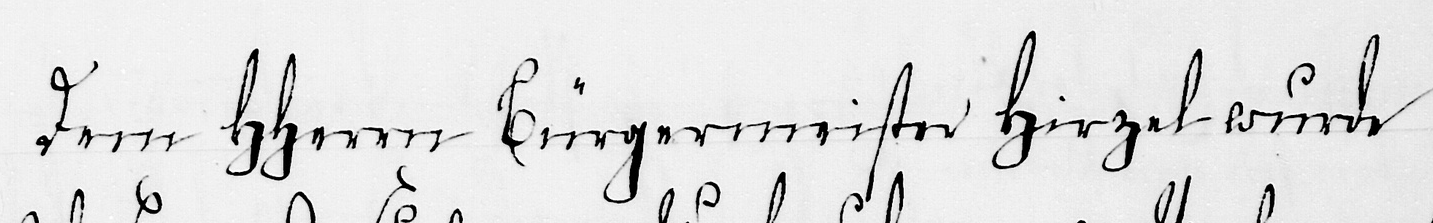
Dem HHerrn Bürgermeister Hirzel wurde
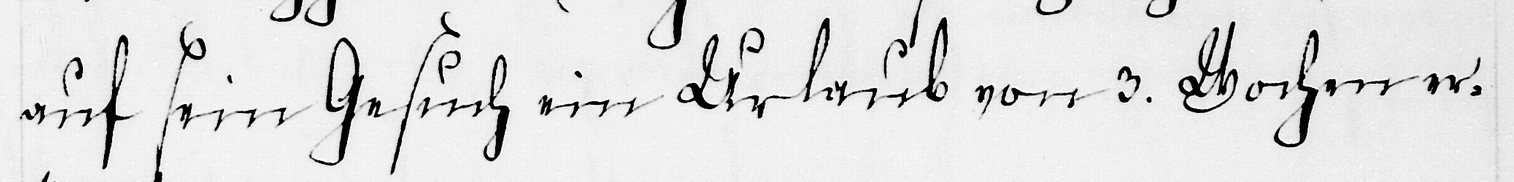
auf sein Gesuch ein Urlaub von 3. Wochen er¬
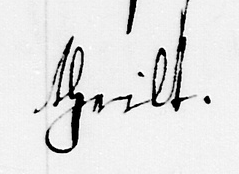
theilt.
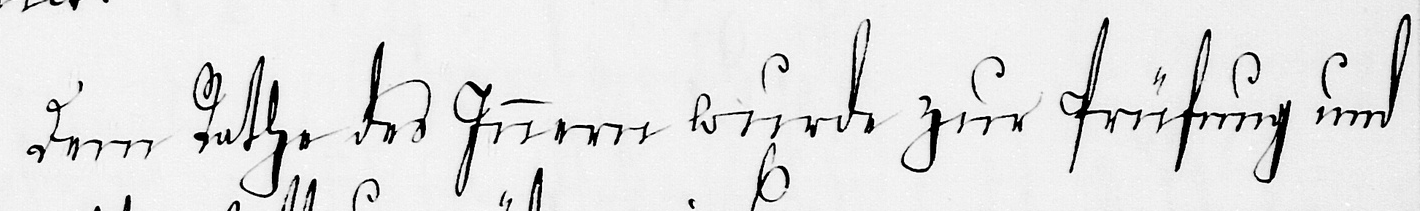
Dem Rathe des Innern wurde zur Prüfung und
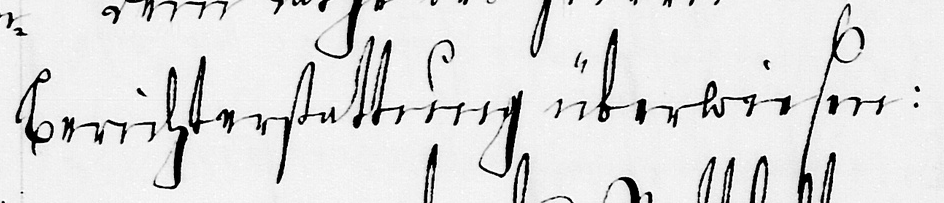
Berichterstattung überwiesen:
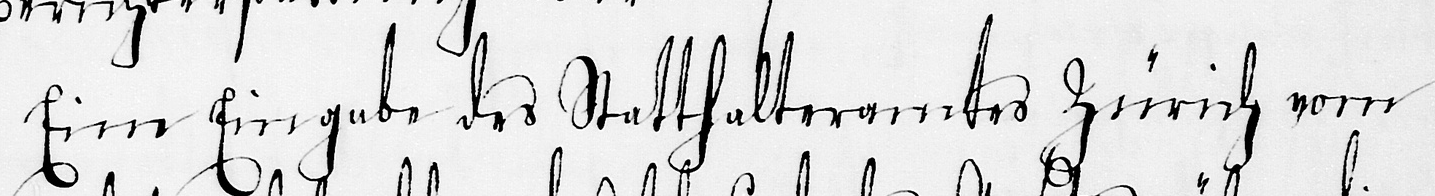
Eine Eingabe des Statthalteramtes Zürich vom
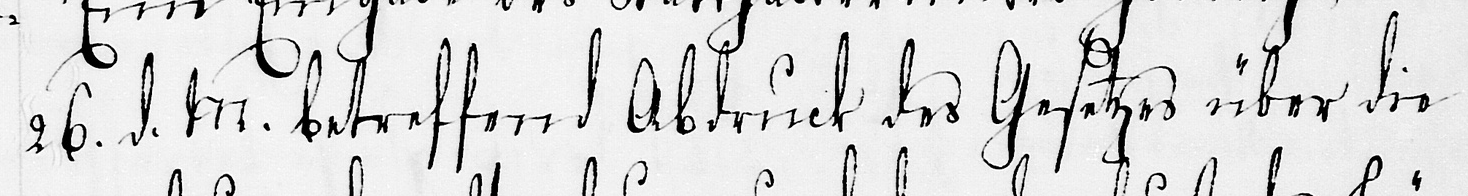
26. d. M. betreffend Abdruck des Gesetzes über die
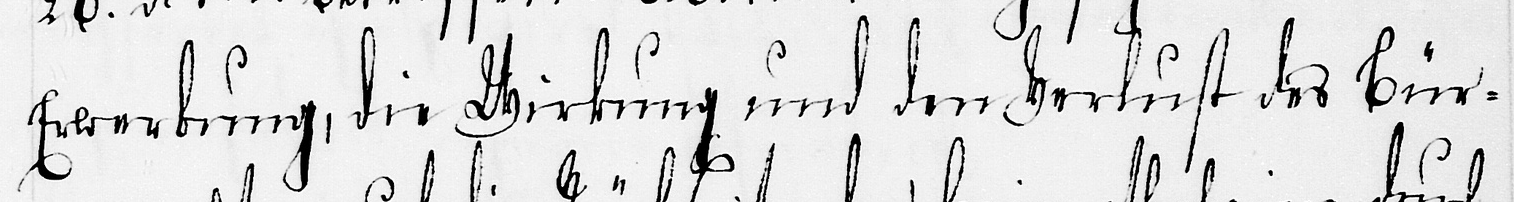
Erwerbung, die Wirkung und den Verlust des Bür¬
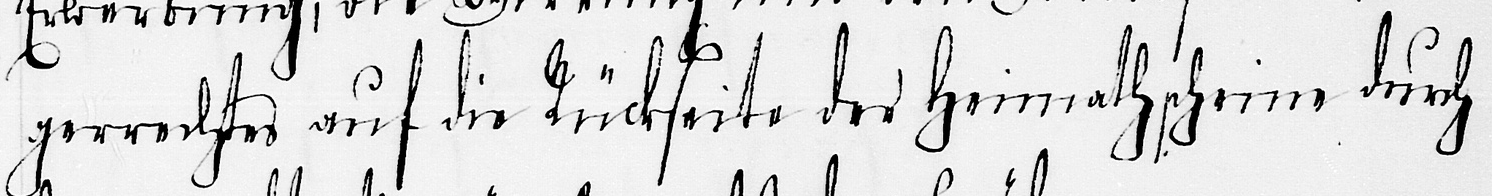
gerrechtes auf die Rückseite der Heimathscheine durch
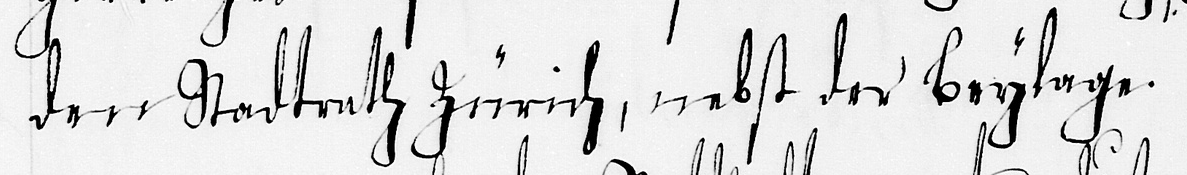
den Stadtrath Zürich, nebst der Beylage.
